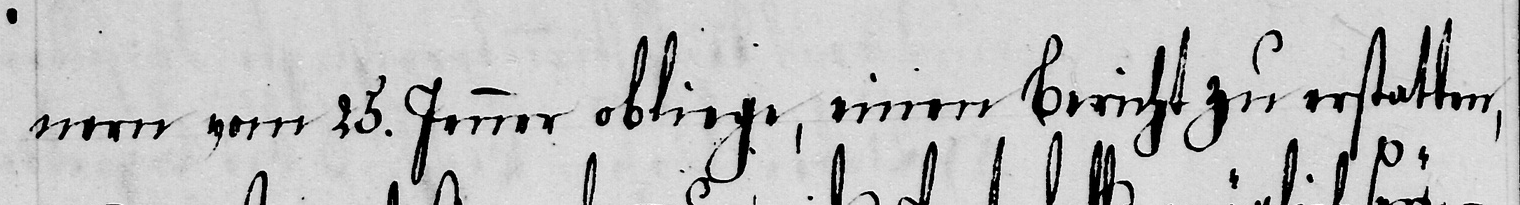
nern vom 25. Jenner obliege, einen Bericht zu erstatten,
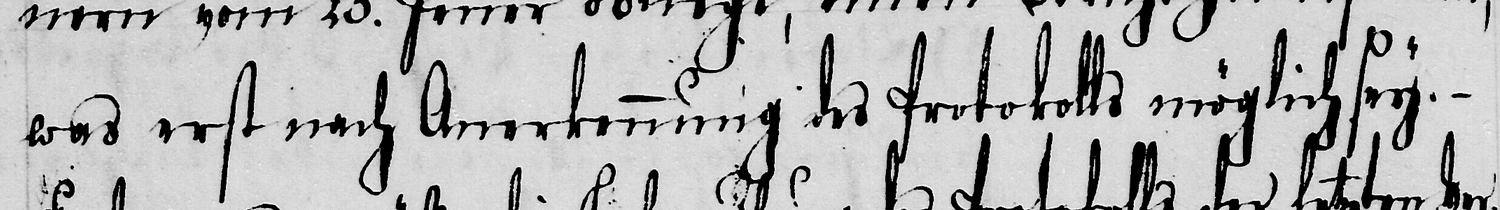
was erst nach Anerkennung des Protokolls möglich sey.
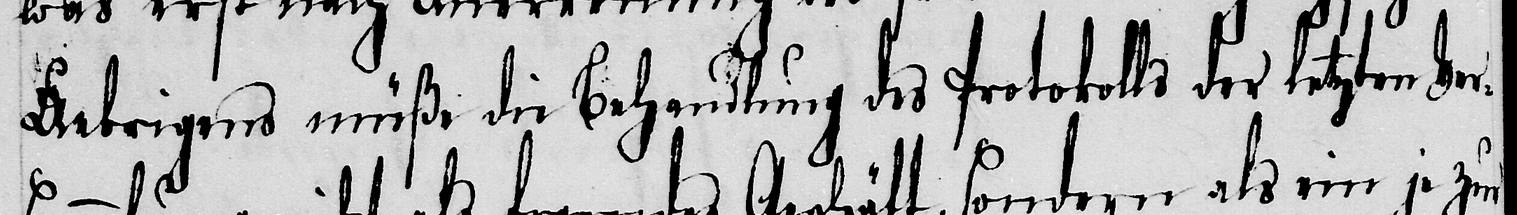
Uebrigens müße die Behandlung des Protokolls der letzten Ver¬
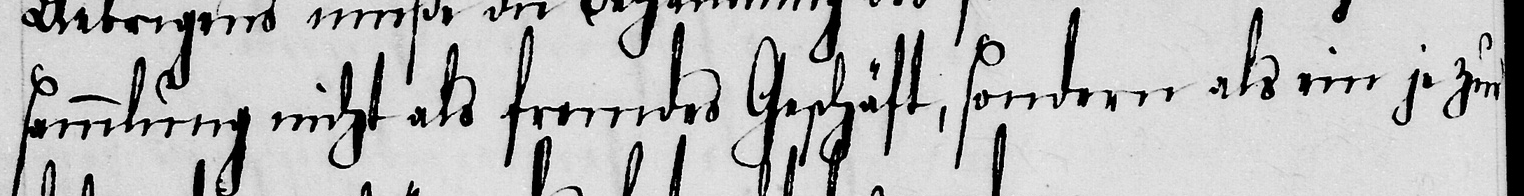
sammlung nicht als fremdes Geschäft, sondern als ein je zur
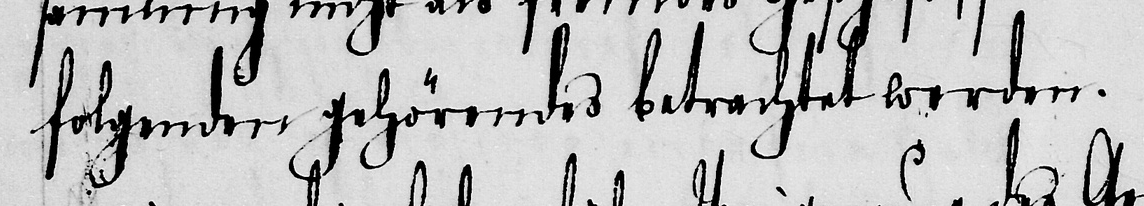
folgenden gehörendes betrachtet werden.
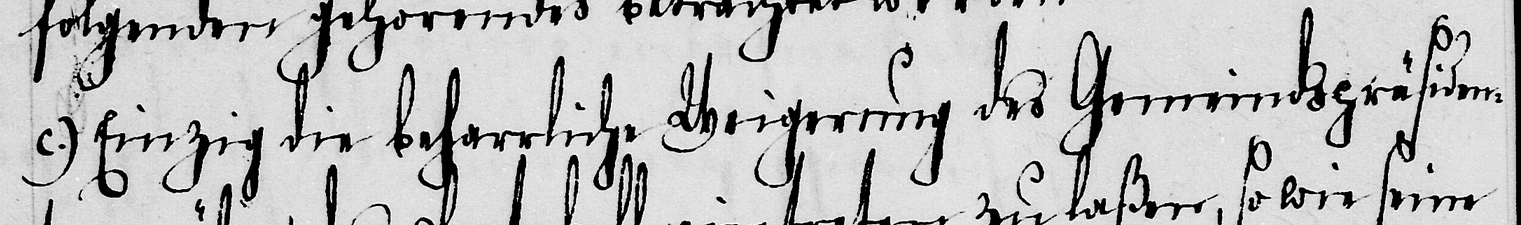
c.) Einzig die beharrliche Weigerung des Gemeindspräsiden¬
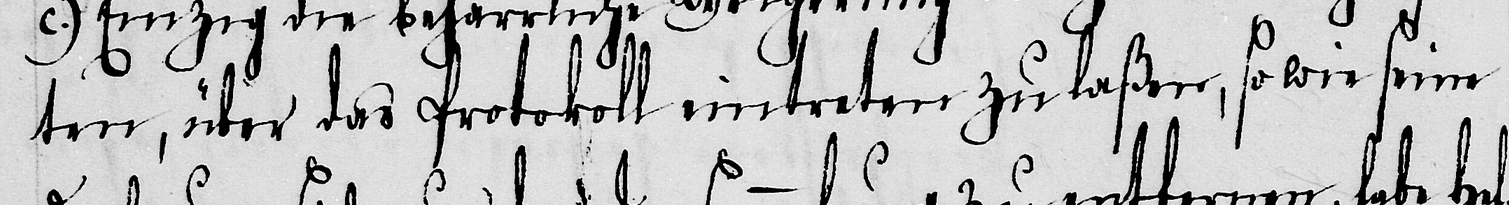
ten, über das Protokoll eintreten zu laßen, so wie seine
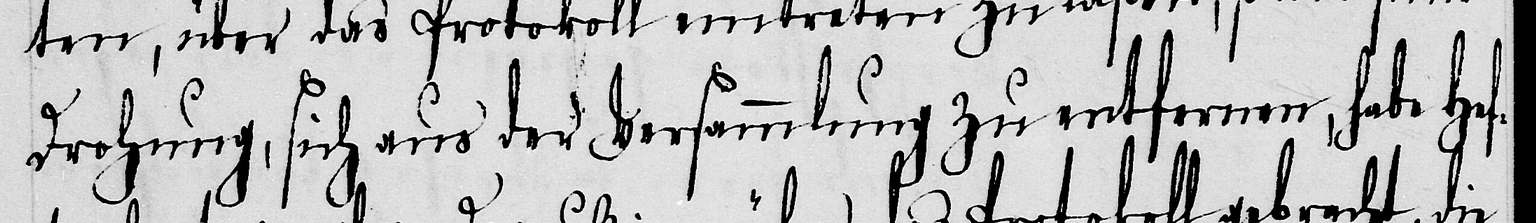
Drohung, sich aus der Versammlung zu entfernen, habe He¬
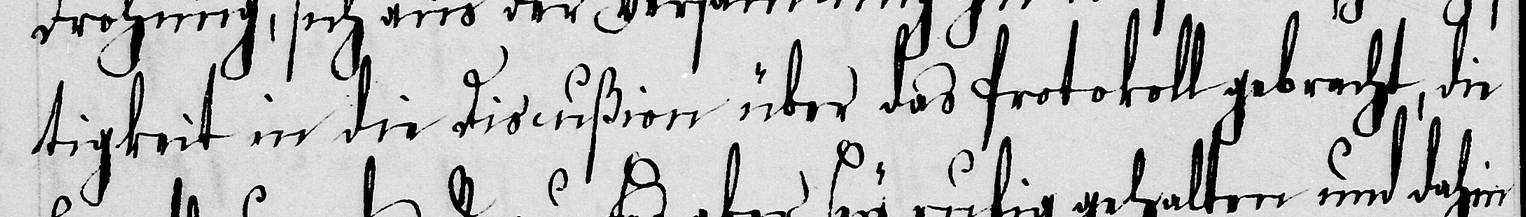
ftigkeit in die Discußion über das Protokoll gebracht, die
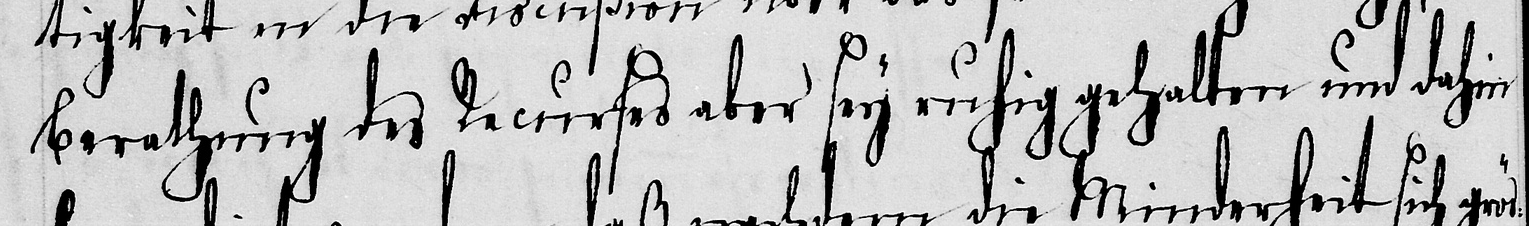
Berathung des Recurses aber sey ruhig gehalten und dahin
